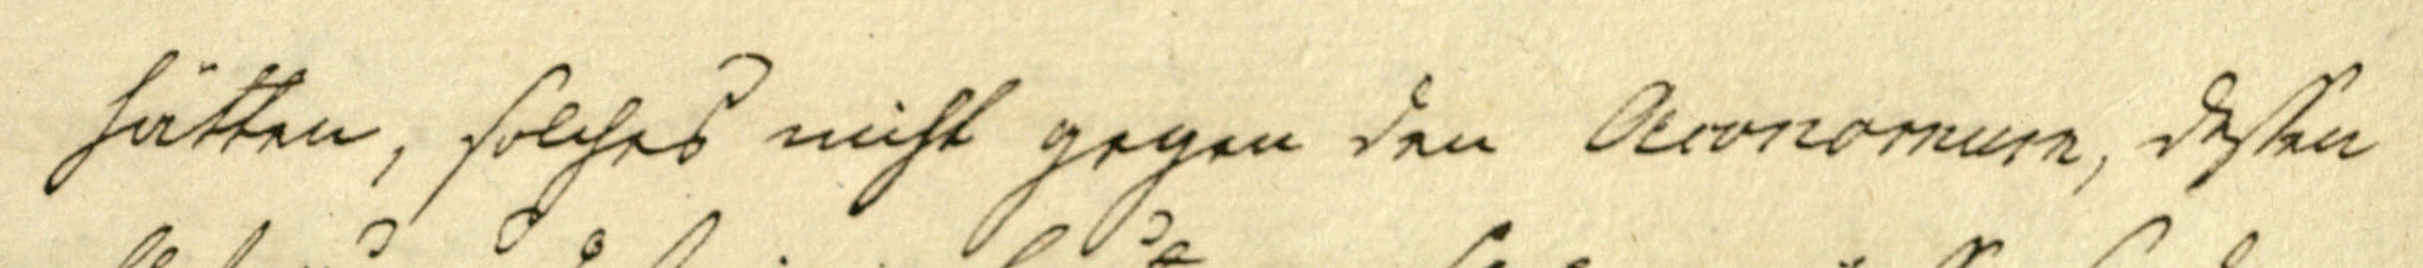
hätten, solches nicht gegen den Oeconomum, dessen
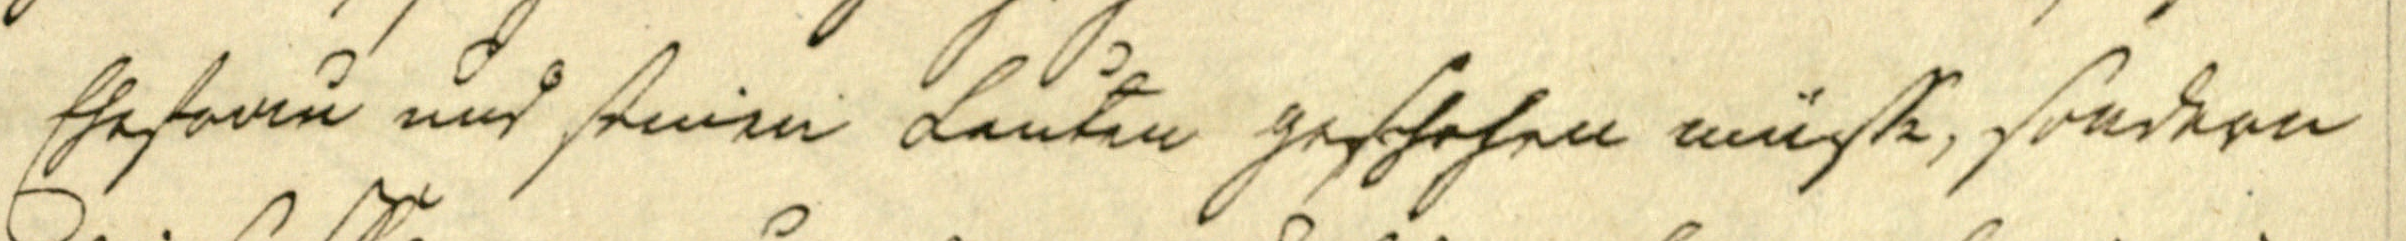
Ehefrau und seinen Leuten geschehen müsse, sondern
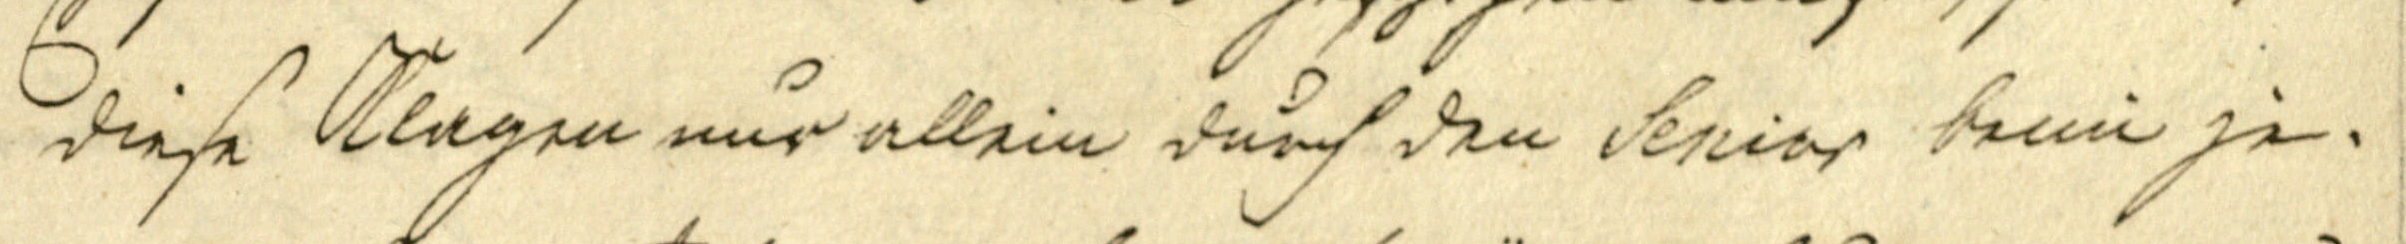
diese Klagen nur allein durch den Senior beim je¬
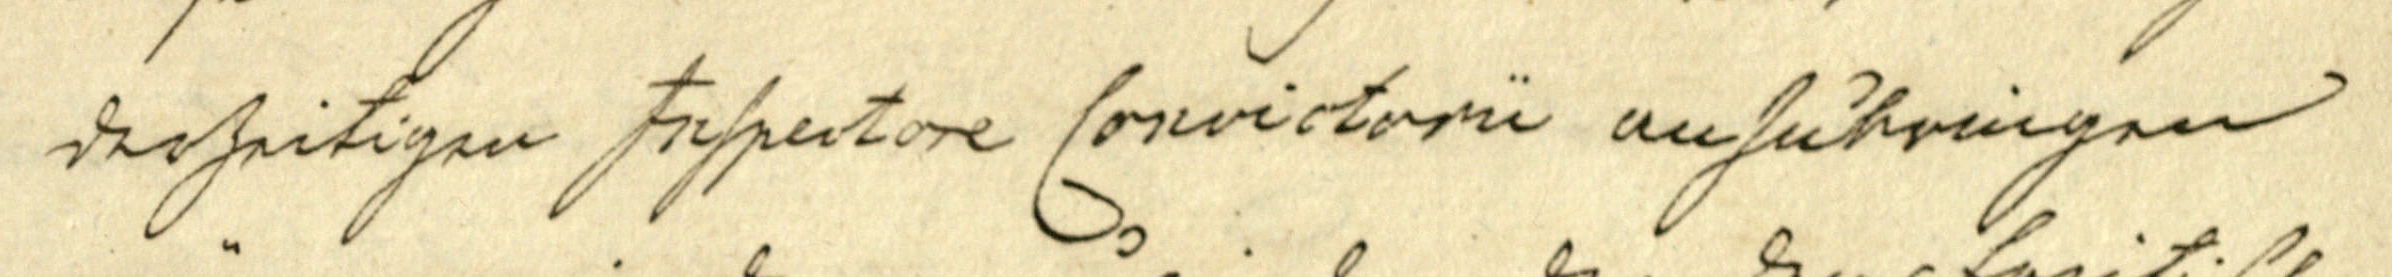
derzeitigen Inspectore Convictorii anzubringen
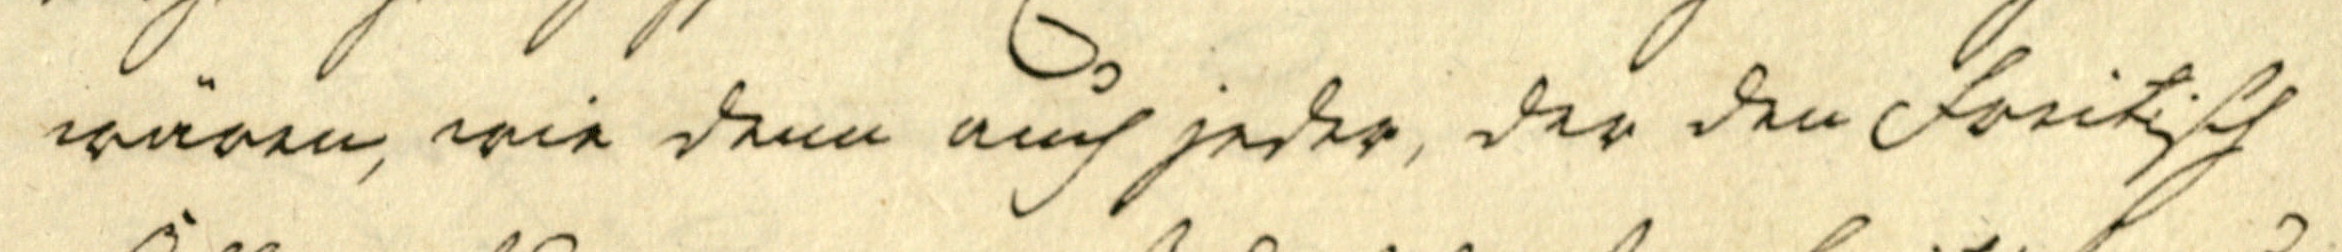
wären, wie denn auch jeder, der den Freitisch
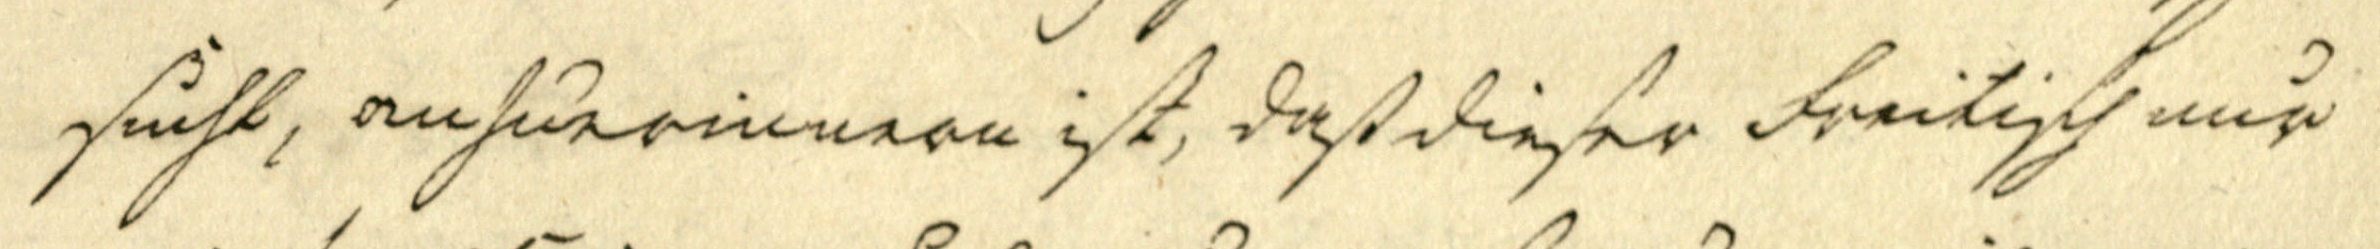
sucht, auzuerinnern ist, daß dieser Freitisch nur
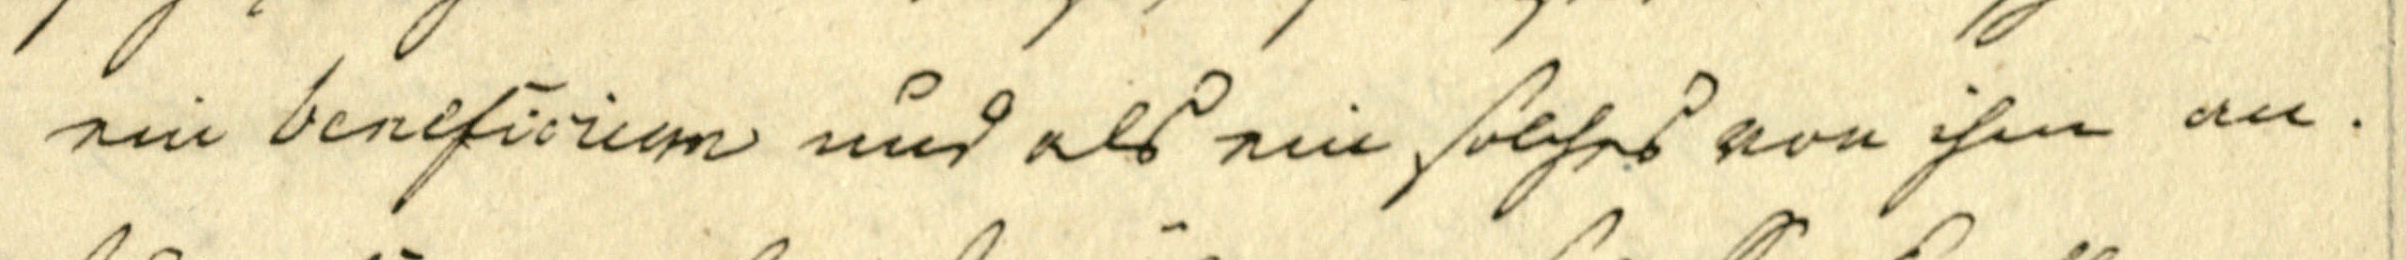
ein beneficium und als ein solches von ihm an¬
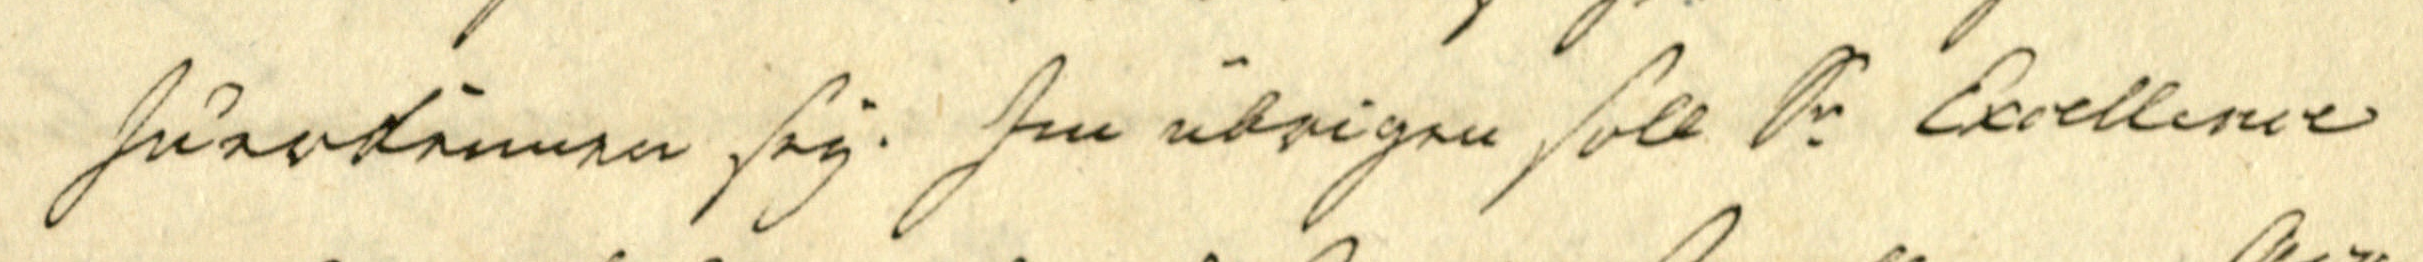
zuerkennen seÿ. Im übrigen soll Sr Excellence
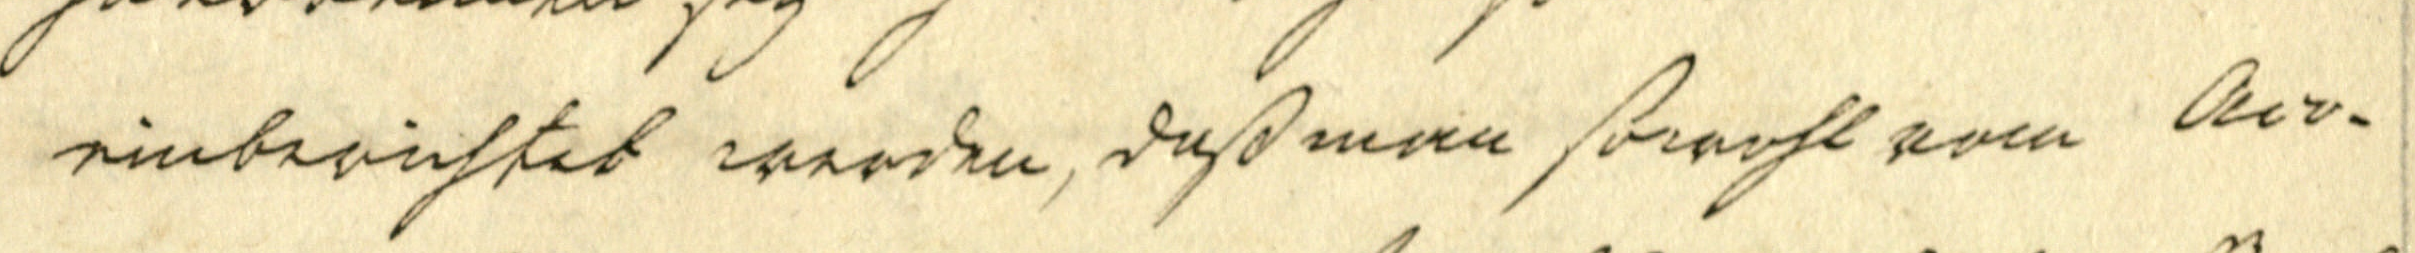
einberichtet werden, daß man sowohl vom Oeco¬
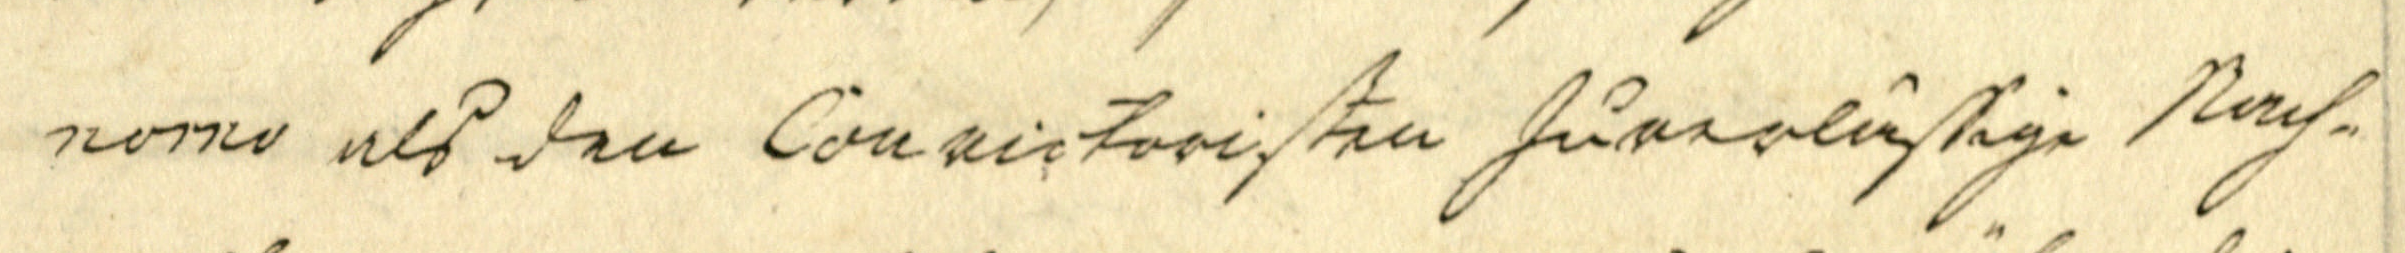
nomo als den Convictoristen zuverlässige Nach¬
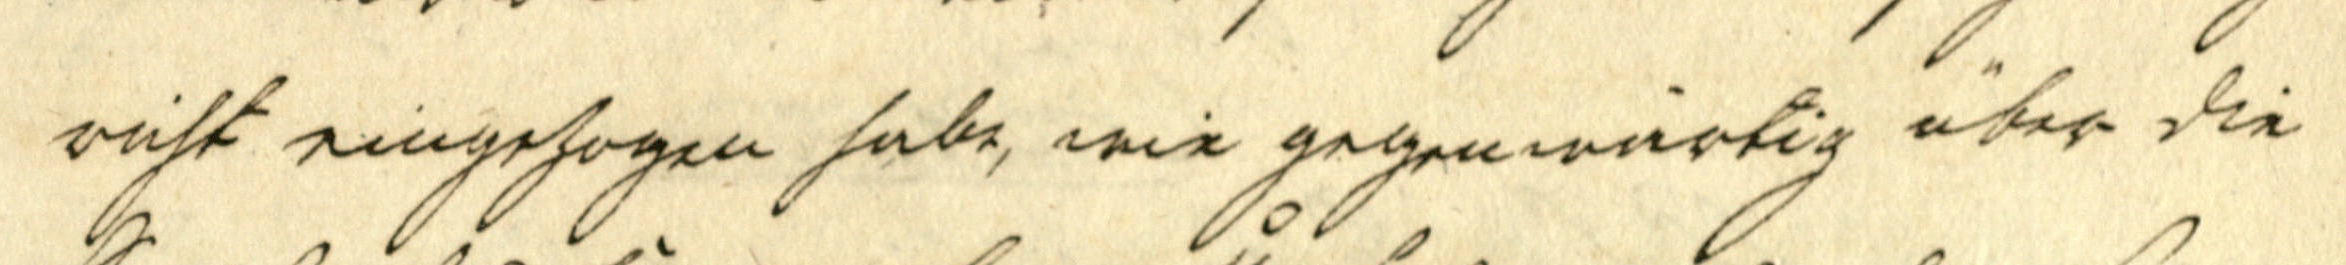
richt eingezogen habe, wie gegenwärtig über die
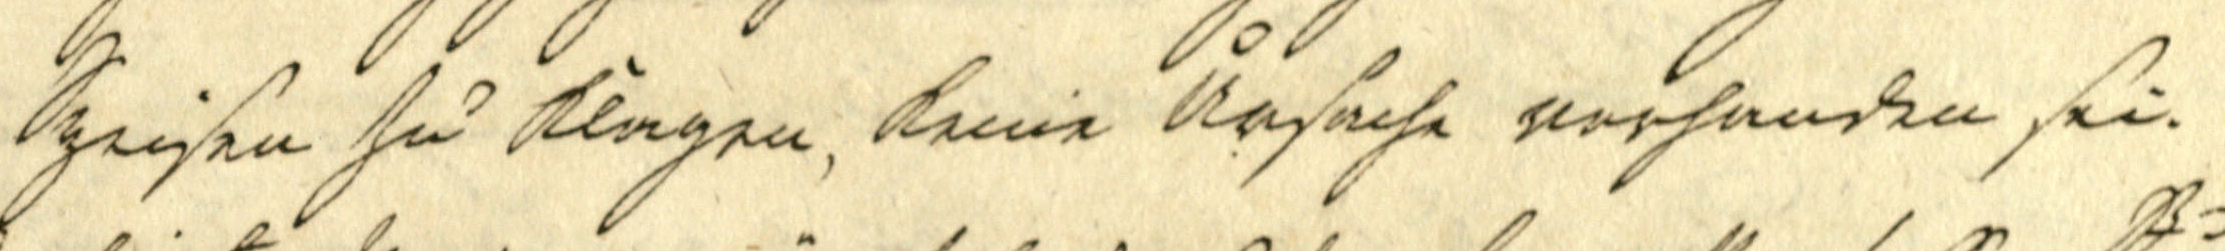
Speisen zu klagen, keine Ursache vorhanden sei.
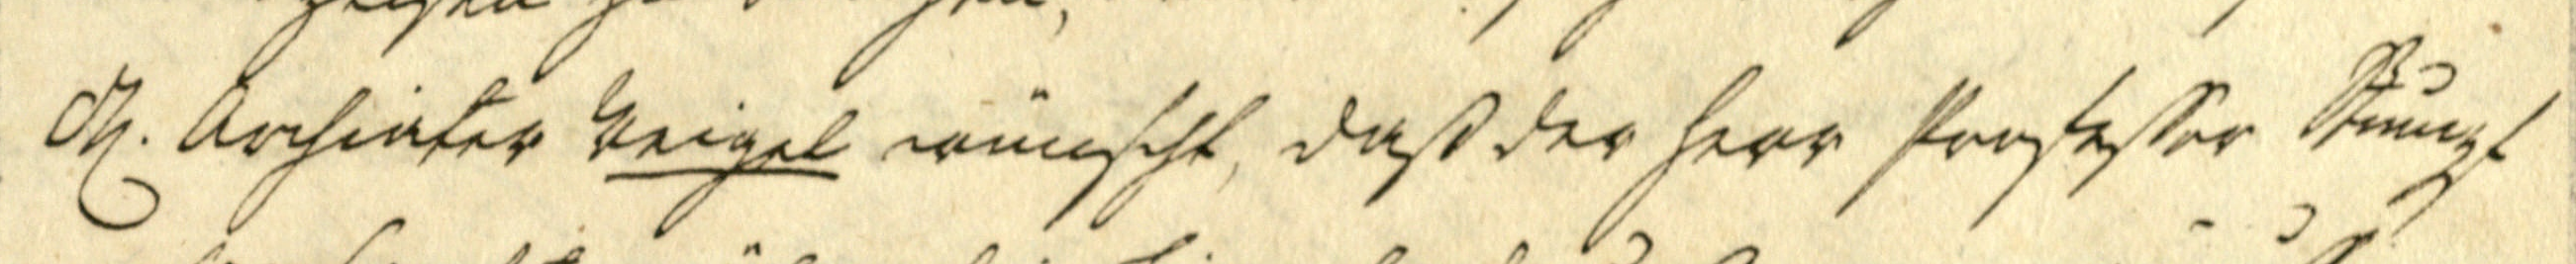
dh. Archiater Weigel wünscht, daß der Herr Professor Stumpf
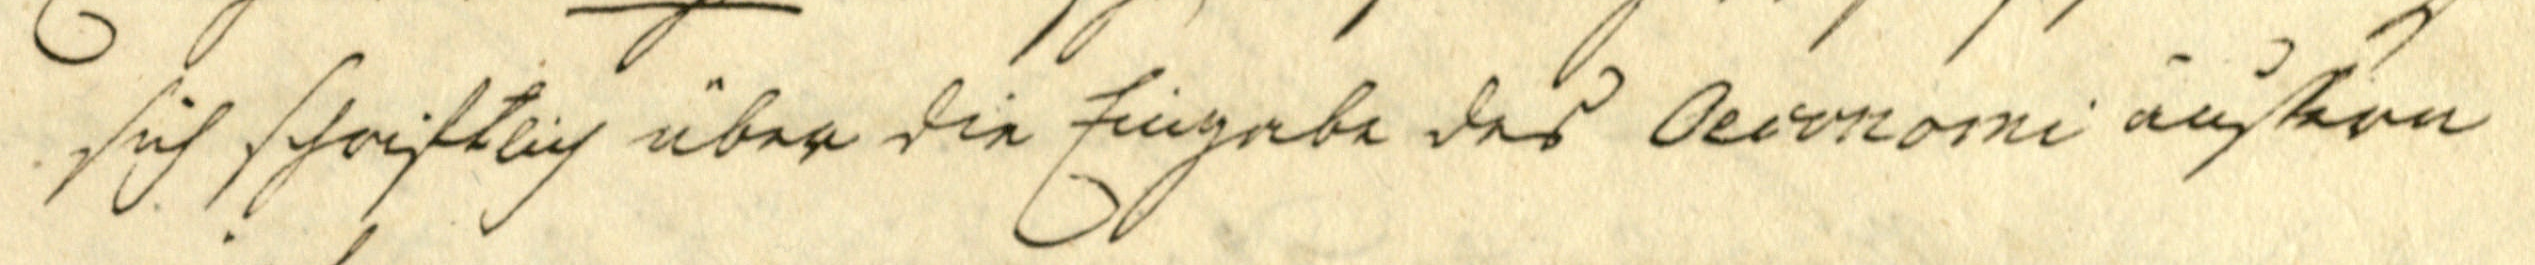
sich schriftlich über die Eingabe des Oeconomi äussern
